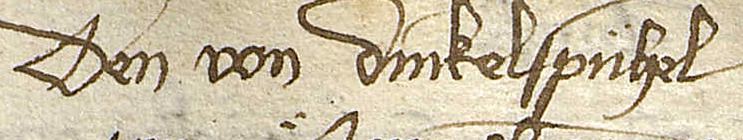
Den von Dinkelſpühel
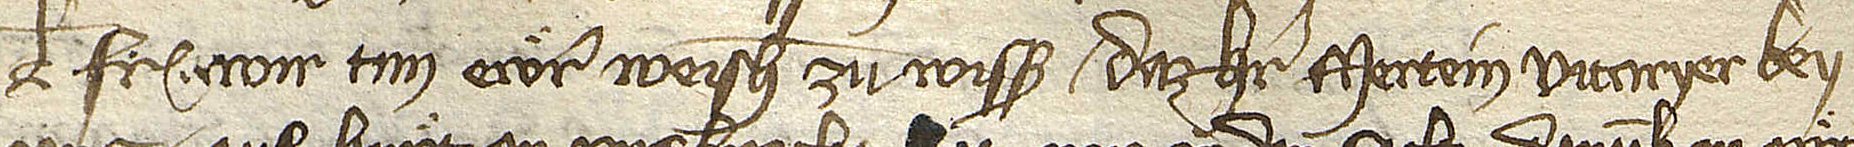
L* fr* . wir tun eẅr* weiſh* ʒu wiſſ* / Daʒ hr* Mertein vicaryer bey
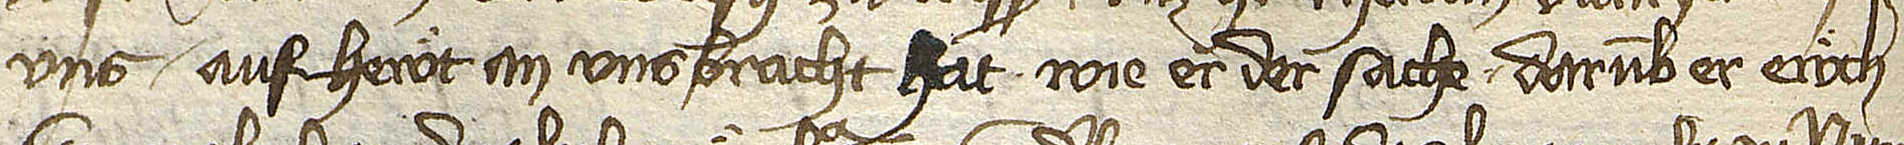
vns / auf heẅt an vns bracht hat . wie er der ſache / Darub* er eẅch
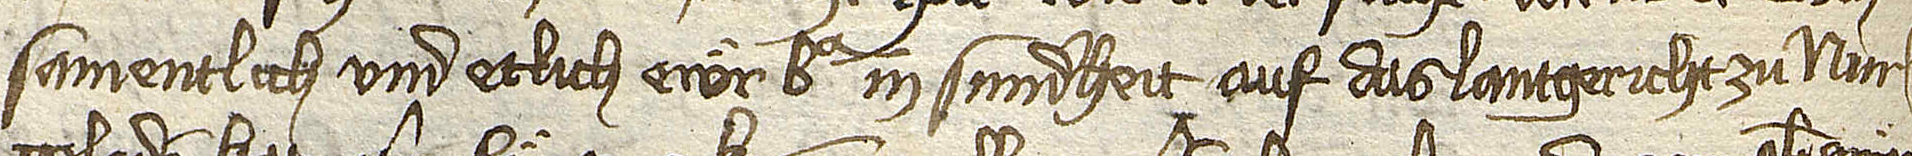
ſamentlich vnd etlich eẅr b* in ſund*heit auf das lantgericht ʒu Nur*
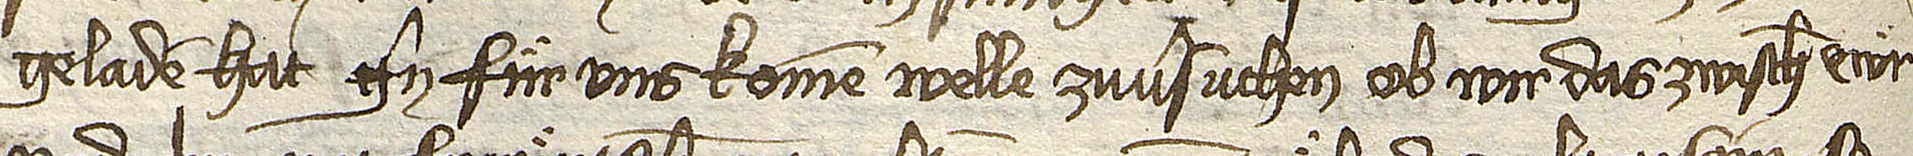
gelade* hat g*n für vns kome* welle ʒuu*ſuchen ob wir das ʒwiſch* eẅr
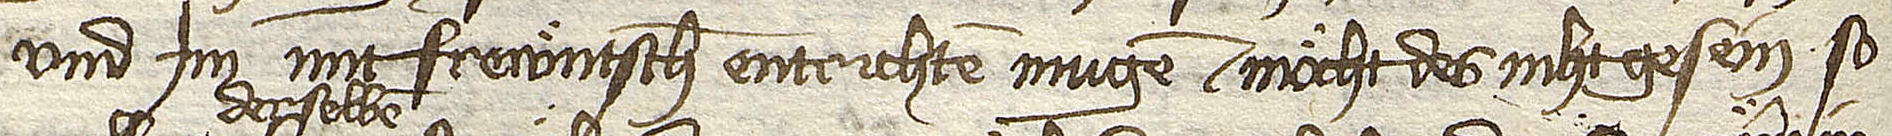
vnd Im mit freẅntſch* entrichte* muge* / möcht des niht geſein ſo
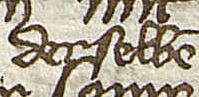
derſelbe*
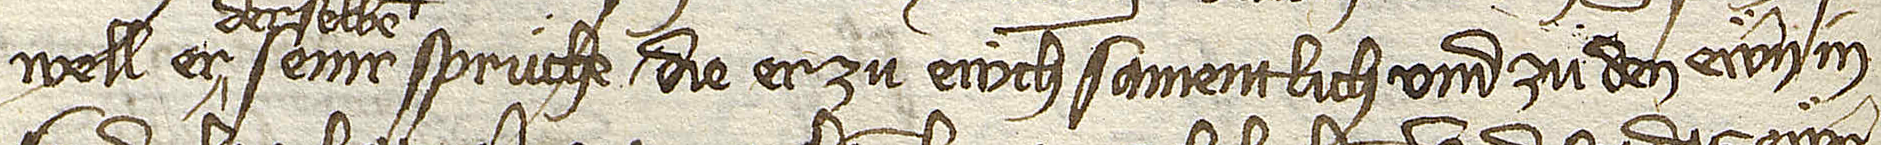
well er ſeinr ſprüche / die er ʒu eẅch ſamentlich vnd ʒu den eẅ*n in
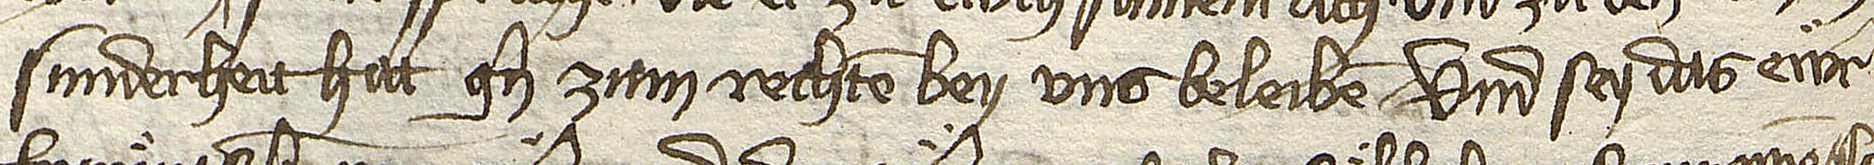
ſunderheit hat g*n ʒum rechte* bey vns beleibe* / Vnd ſey das eẅr*
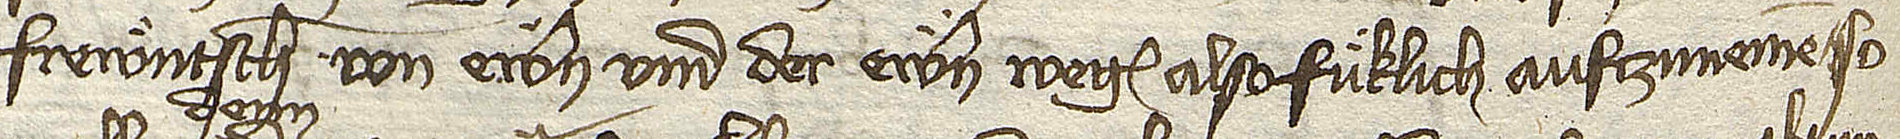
freẅntſch* von eẅ*n vnd der eẅ*n weg* alſo füklich aufcʒuneme* / ſo
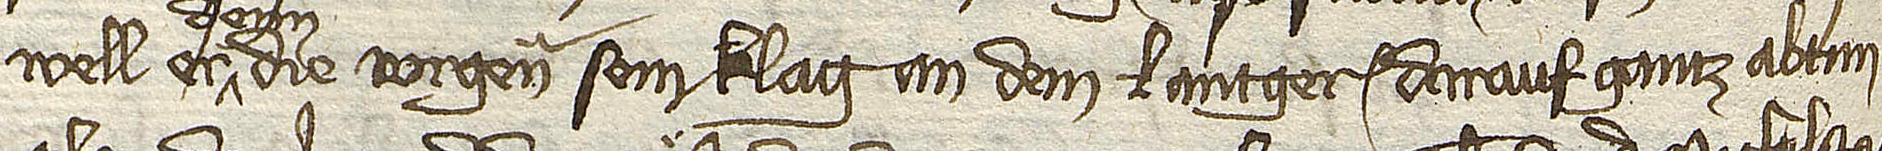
well er die vorgen* ſein klag an dem Lantger* darauf gancʒ abtun
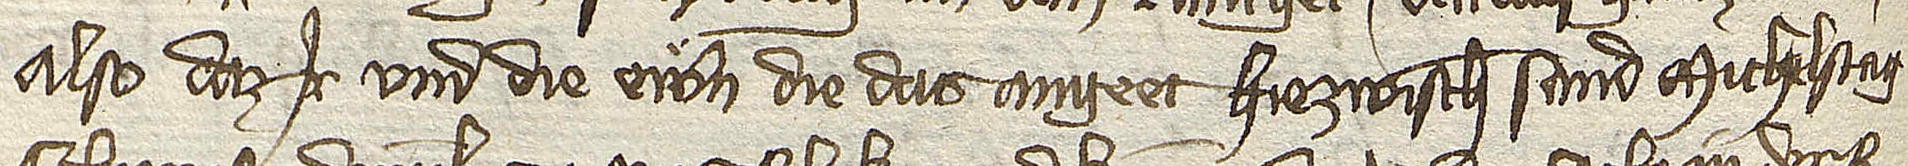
Alſo daʒ Ir vnd die eẅ*n die das angeet hieʒwiſch* ſand Michelſtag
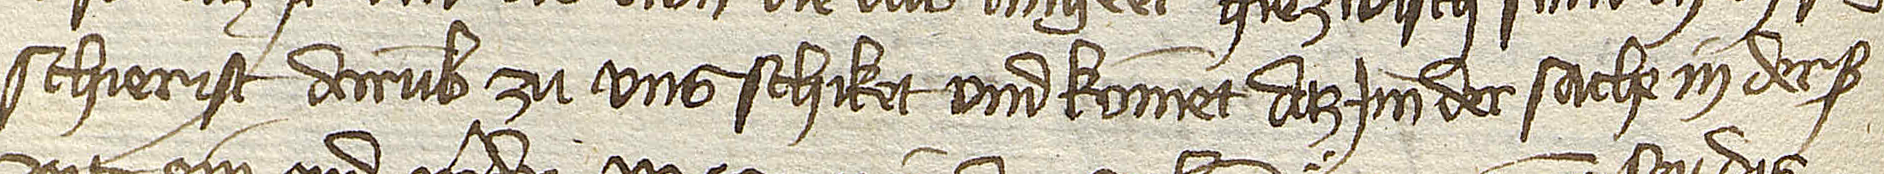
ſchieriſt darub* ʒu vns ſchiket vns kom*et daʒ Im der ſache in derſ*
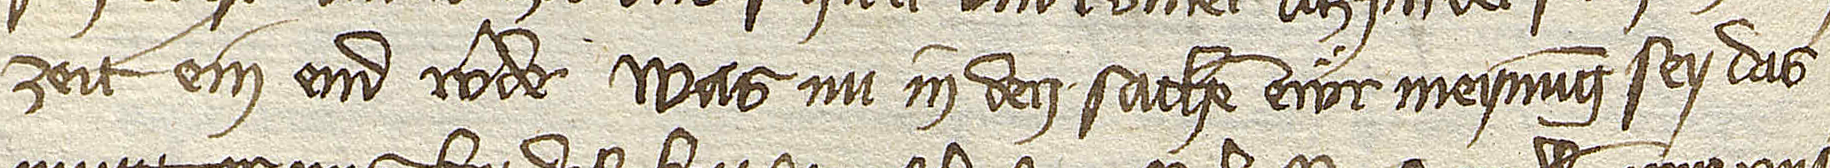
ʒeit ein end w*de Was nu in den ſache* eẅr meynu*g ſey das
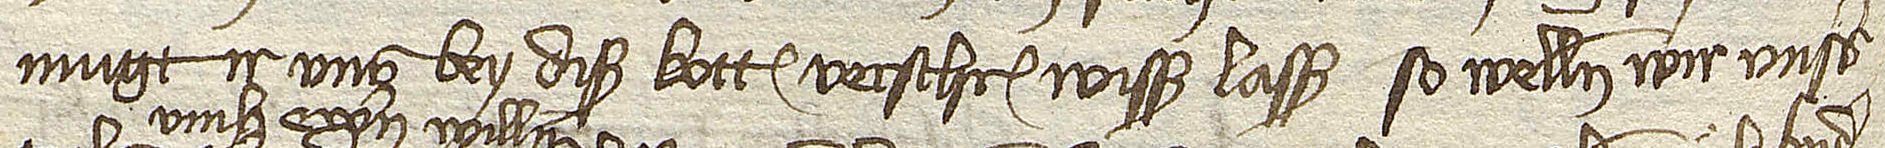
mugt ir vns bey diſ* bott* verſchr* wiſſ* laſſ* ſo welln* wir vnſ*s
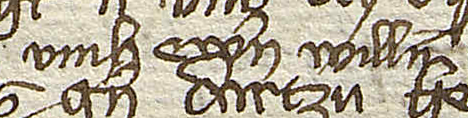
vmb ew*n willn*
